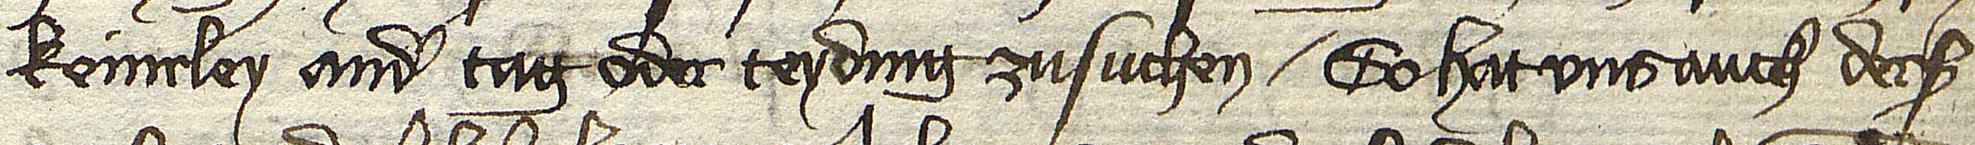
keinrley and* tag oder teyding ʒu ſuchen / So hat vns auch derſ*
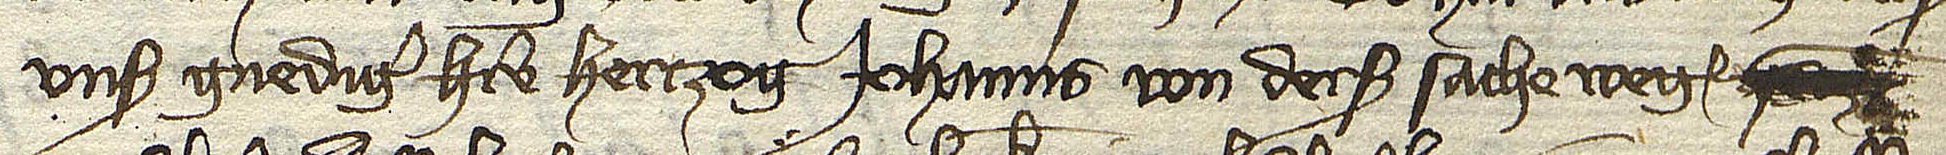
vnſ* gnedig* h*re hercʒog Iohanns von derſ* ſache weg* yecʒ*
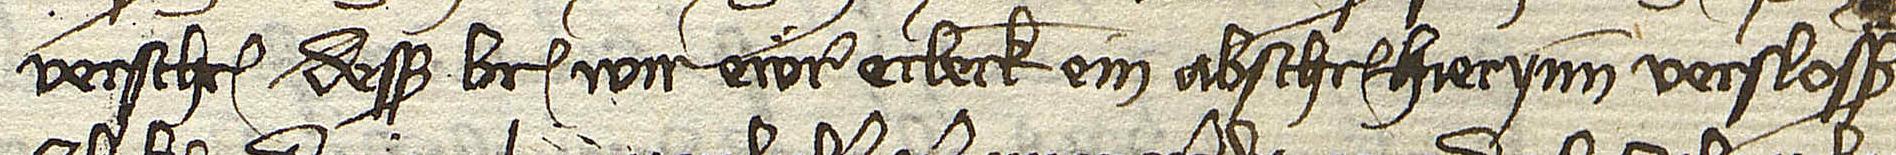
verſchr* / Deſſ* br* wir ew*r erberk* ein abſchr* hierynn* verſloſſ*
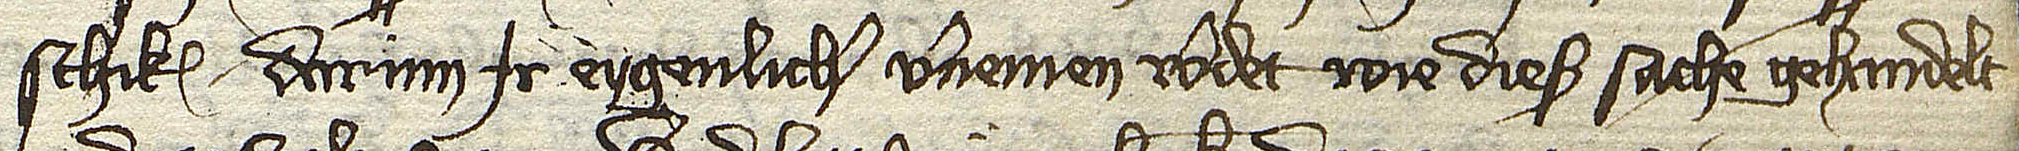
ſchik* / Darinn Ir eygenlich* v*nemen w*det wie dieſ* ſache gehandelt
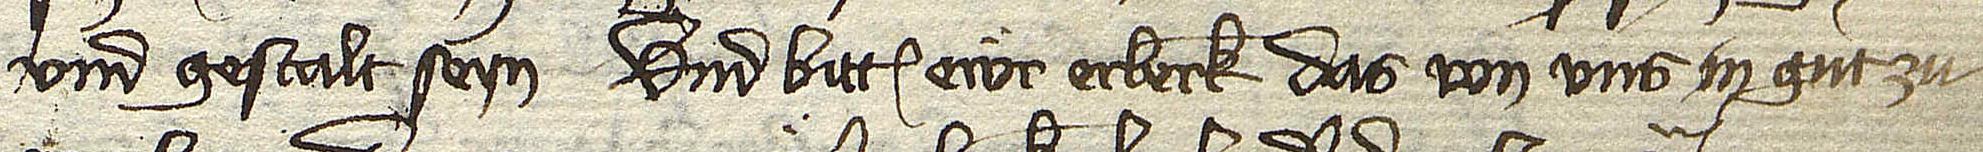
vnd geſtalt ſeyn Vnd bitt* ewr erberk* das von vns in gut ʒu
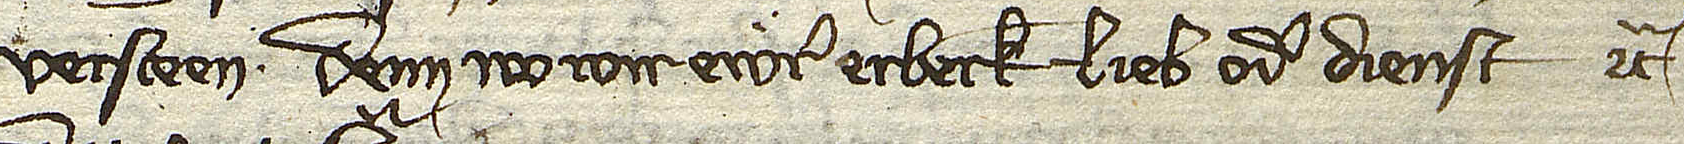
verſteen . Denn wo wir ewr erberk* lieb od* dienſt ec*
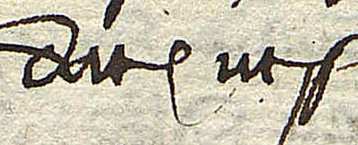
Dat* ut ſ*
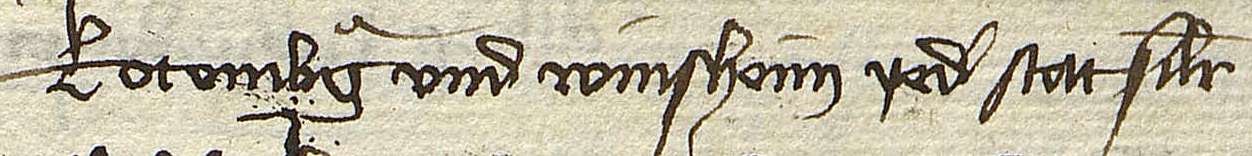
Rotemb*g vnd winſheim yed* ſtat ſilr*
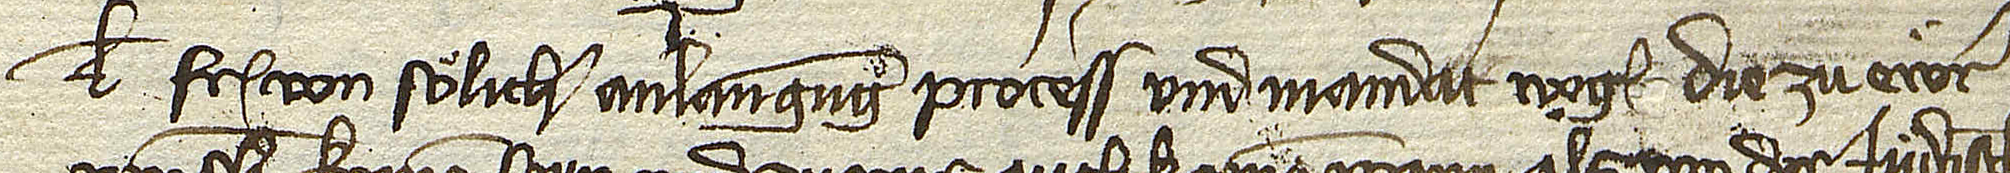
L* fr* von ſölich* anlangu*g proceſſ vnd mandat weg* die ʒu ew*r
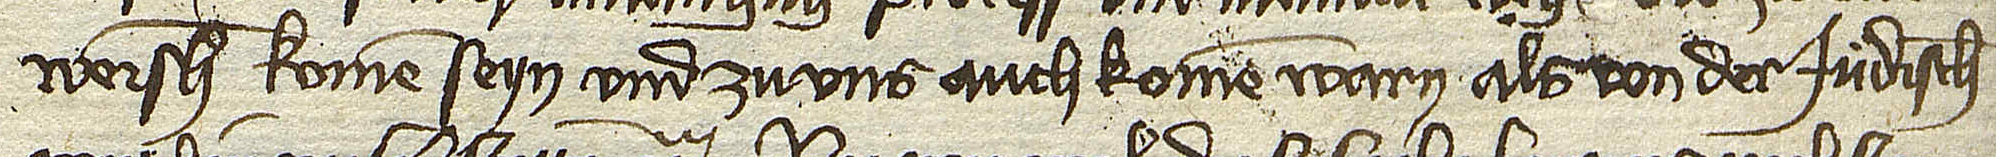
weiſh* kome* ſeyn vnd ʒu vns auch kome* warn als von der Iüdiſch*
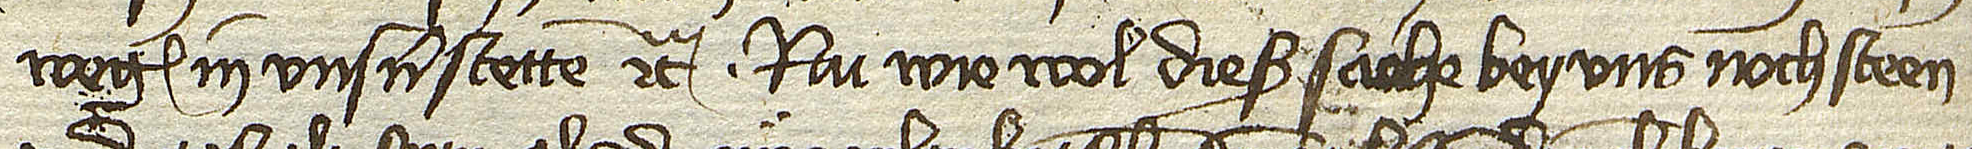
weg* in vnſ*n ſtette* ec* . Nu wie wol dieſ* ſache bey vns noch ſteen
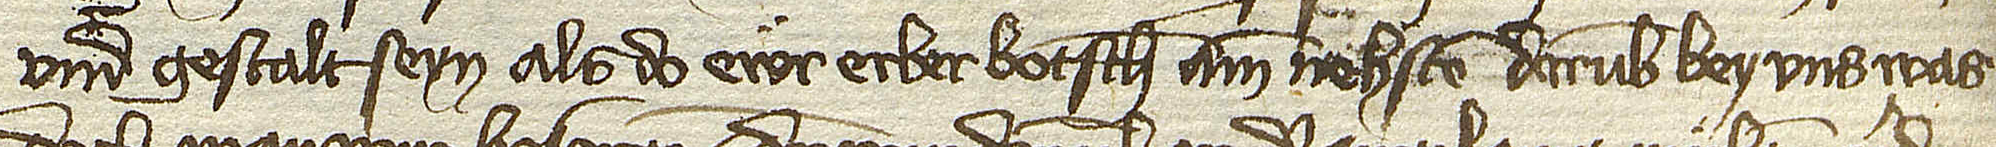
vnd geſtalt ſeyn als do ewr erber botſch* am* nehſte* daru*b bey vns was .
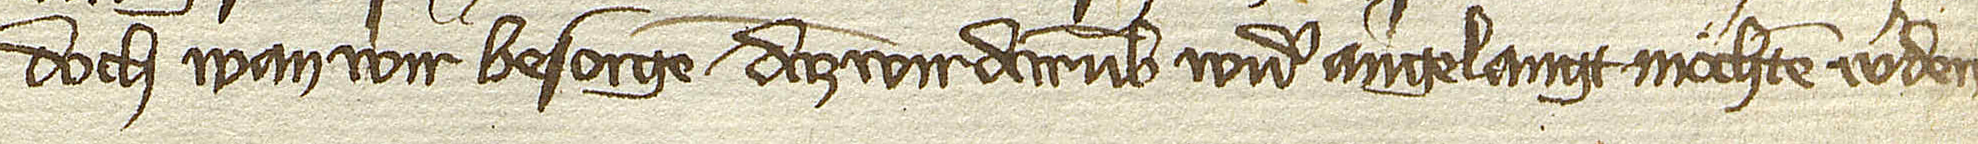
Doch wan wir beſorge* / daʒ wir daru*b wid* angelangt möchte* w*den
